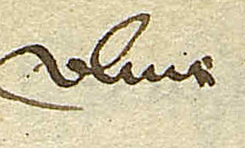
vlme
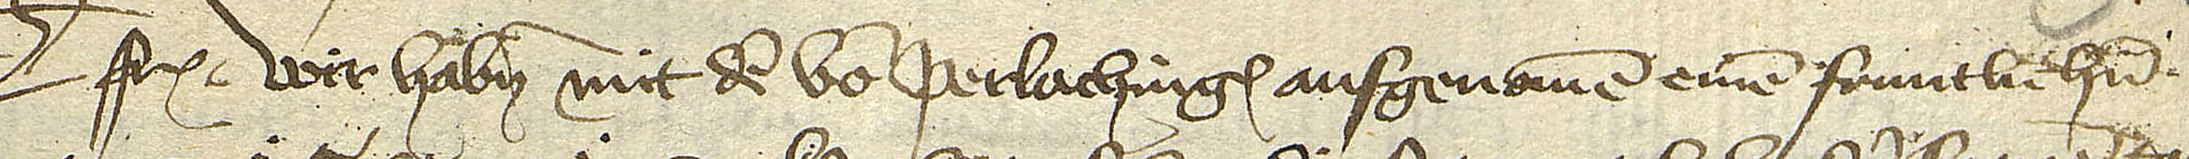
L* fr* / Wir habn* mit d* vo* Perlaching* aufgenome* eine fruntlichn*
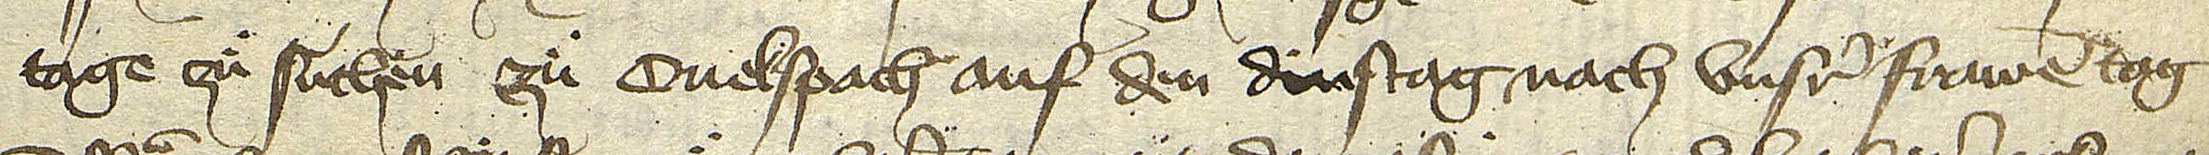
tage cʒü ſüchen cʒü Onelſpach auf den dinſtag nach vnſr* frawe* tag
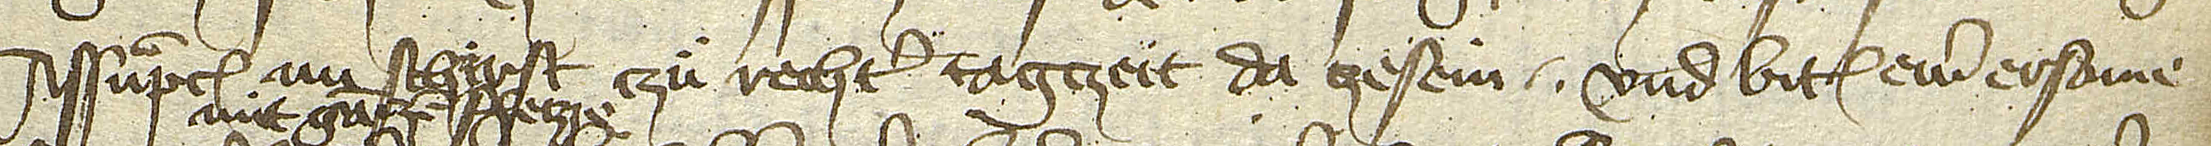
Aſſupc* nu ſchirſt cʒü recht* tagcʒeit da cʒeſein / . vnd bit* ew* erſame
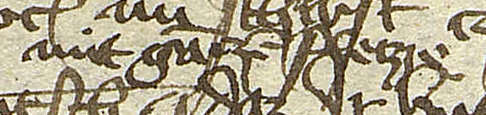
mit gacʒe* fleiʒʒe
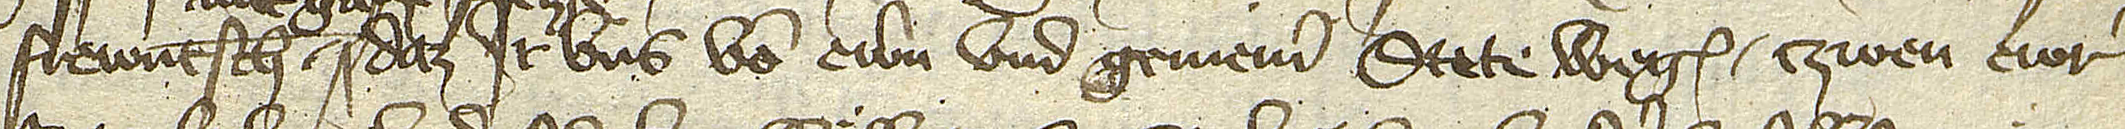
frewntſch* / daʒ Ir vns vo* ewn* vnd gemein* Stete weg* / cʒwen ewr*
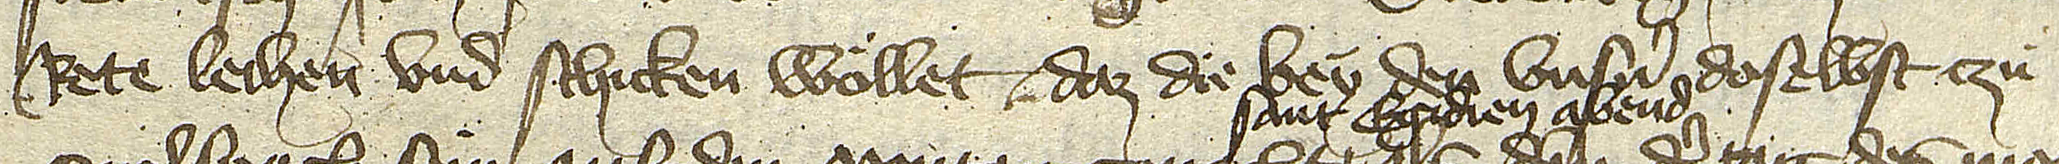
Rete leihen vnd ſchicken wöllet / daʒ die bey den vnſn* doſelbſt cʒü
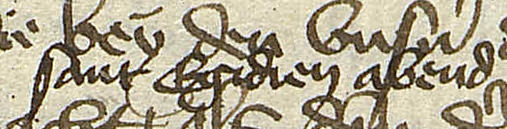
ſant Egidien abend
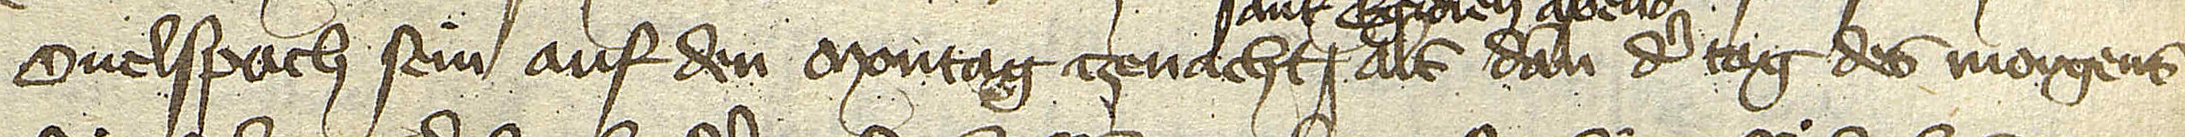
Onelſpach ſein auf den Montag cʒenacht als dan* d* tag des morgens
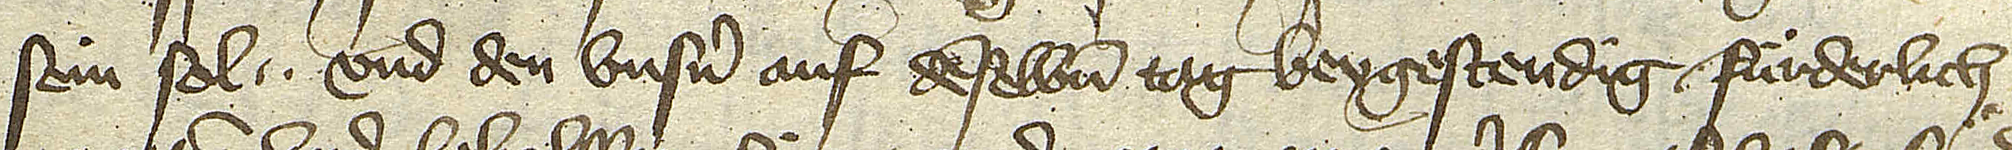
ſein ſol / . vnd den vnſn* auf deſelbn* tag bey geſtendig / fürderlich
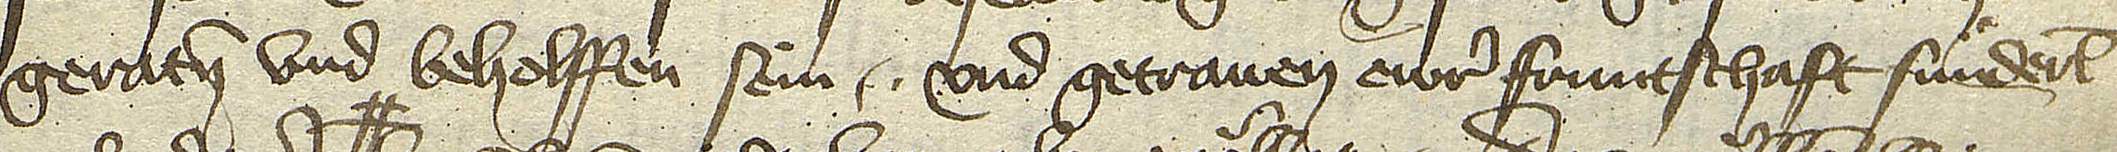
geratn* vnd beholffen ſein / . vnd getrawen ewr* fruntſchaft ſünderl*
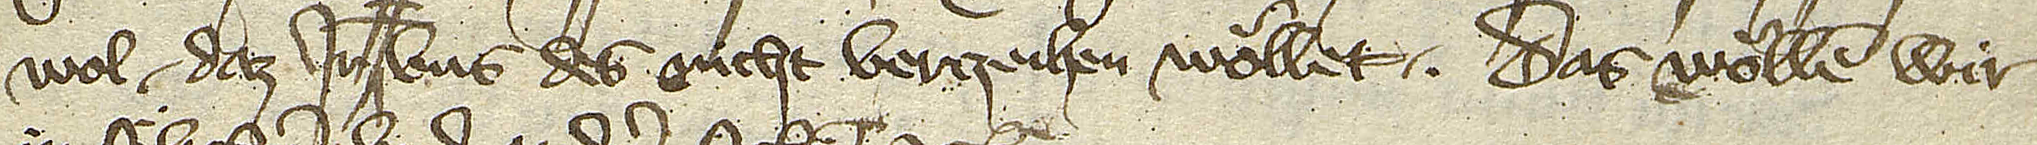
wol / daʒ Ir vns des nicht vercʒeihen wöllet / . Das wölle* wir
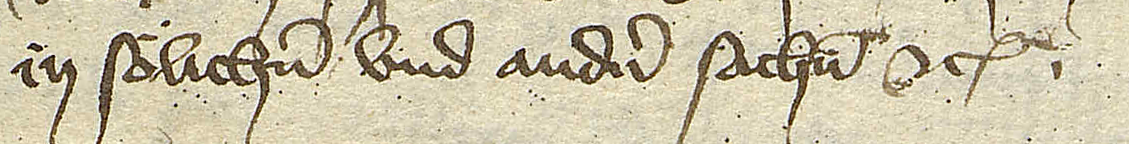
in ſölichn* vnd andn* ſachn* ec* .
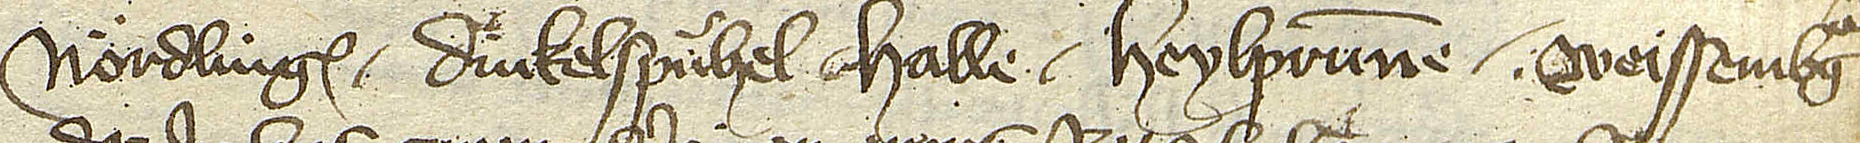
Nördling* / Dinkelſpühel / halle / heylſprune* / . weiſſembg*
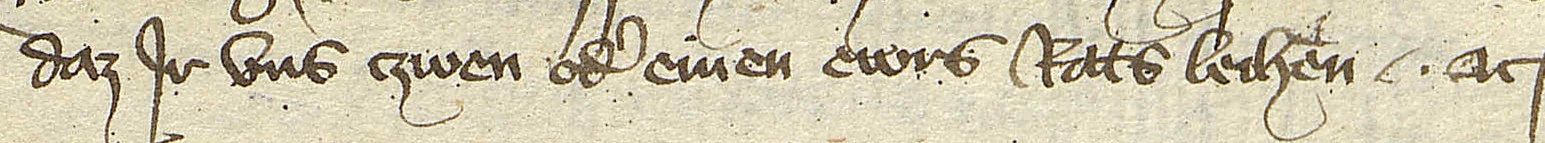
daʒ Ir vns cʒwen od* einen ewrs Rats leihen / . ec*
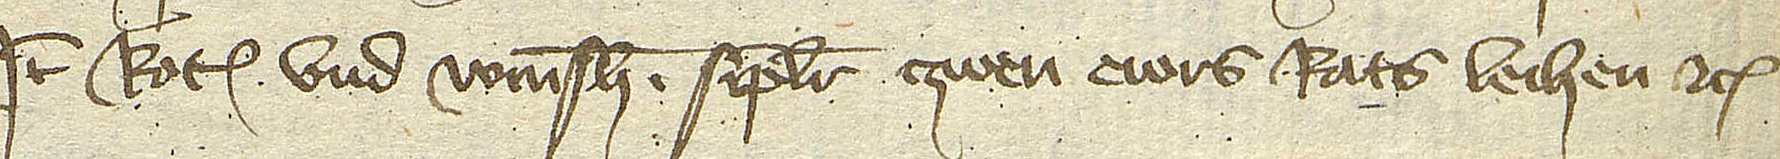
It Rot* vnd winſh* ſiplr* cʒwen ewrs Rats leihen ec*
